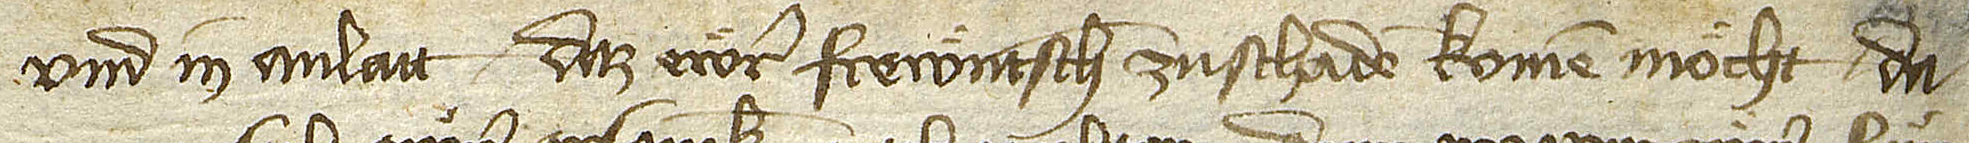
vnd in anlait / daʒ ew*r frewntſch* ʒuſchade* kome* möcht / da
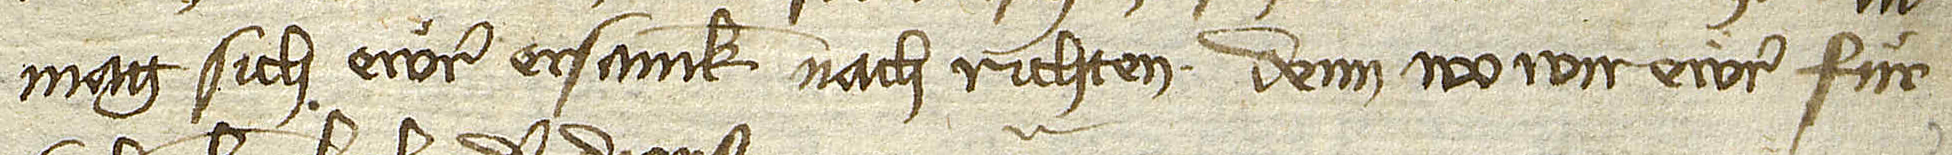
mag ſich ew*r erſamk* nach richten . Denn wo wir ew*r für
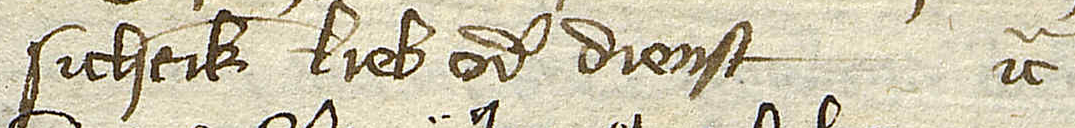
ſichtik* lieb od* dienſt ec*
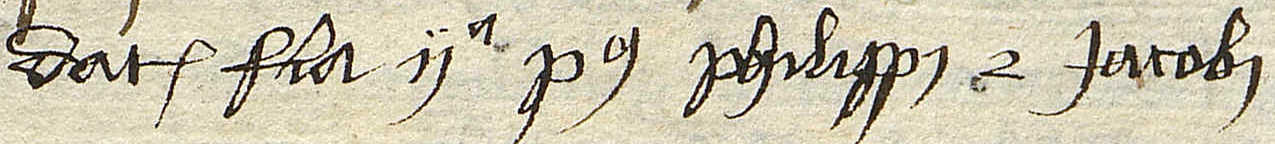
Dat* fia* ii* p* philippi @ Iacobi
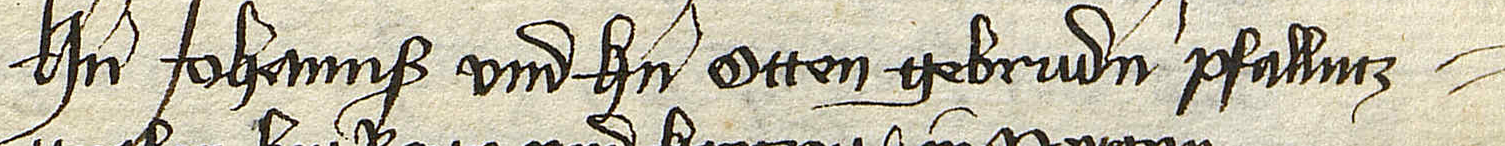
H*n Iohannſ* vnd h*n Otten gebrud*n pfallncʒ =
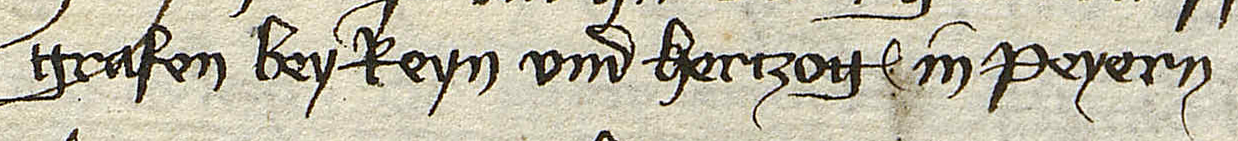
grafen bey Reyn vnd hercʒog* in Peyern
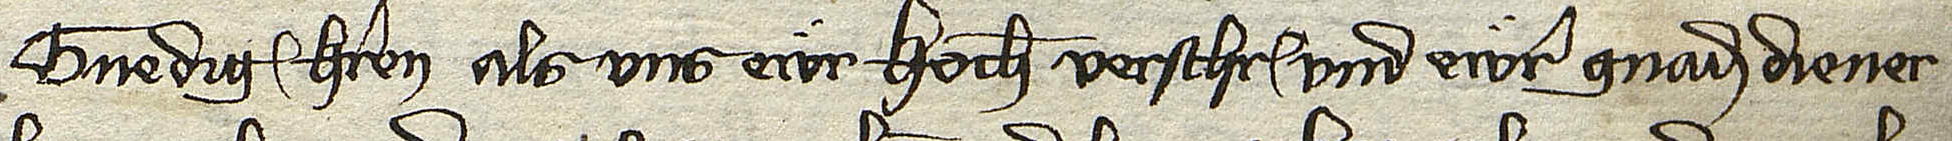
Gnedig* h*ren als vns ewr hoch* verſchr* vnd ew*r gnad* diener
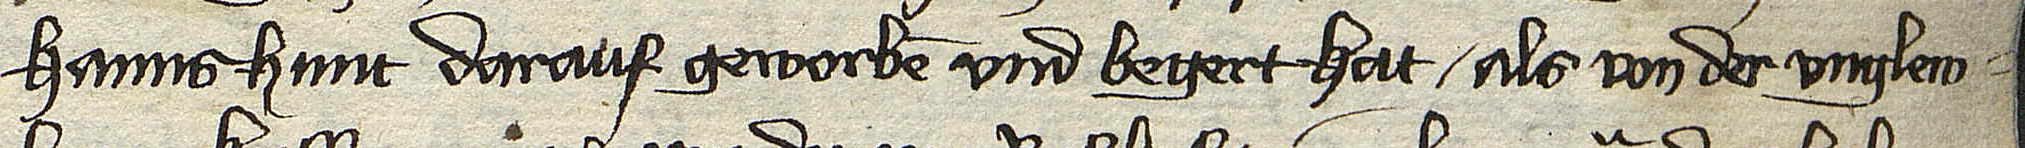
hanns hunt darauf geworbe* vnd begert hat / als von der vnglew =
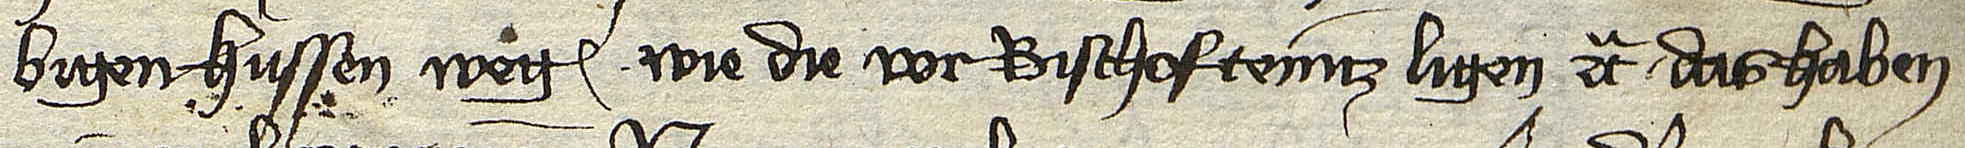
bigen huſſen weg* . wie die vor Biſchofteincʒ ligen ec* / das haben
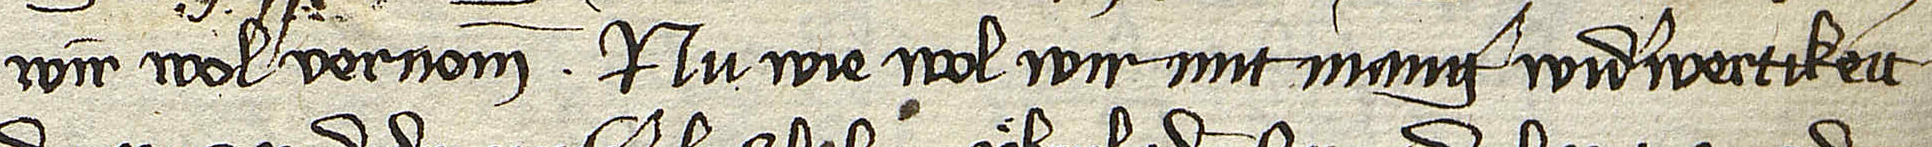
wir wol vernom* . Nu wie wol wir mit mang* wid*wertikeit
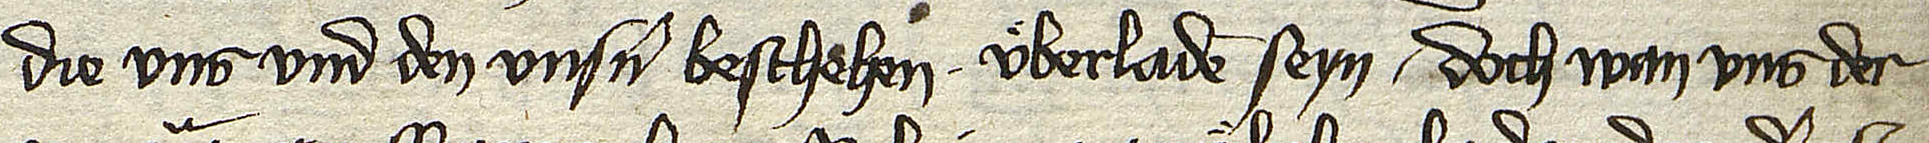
die vns vnd den vnſ*n beſchehen . v̈berlade* ſeyn / Doch wan vns der
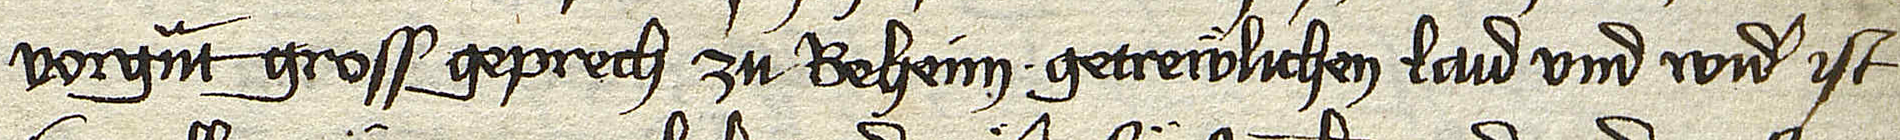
vorg*nt* groſſ geprech ʒu Beheim . getrewlichen laid vnd wid* iſt
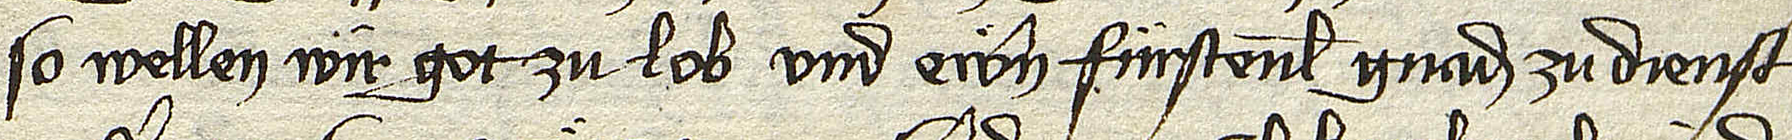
ſo wellen wir got ʒu lob vnd ew*n fürſtenl* gnad* ʒu dienſt
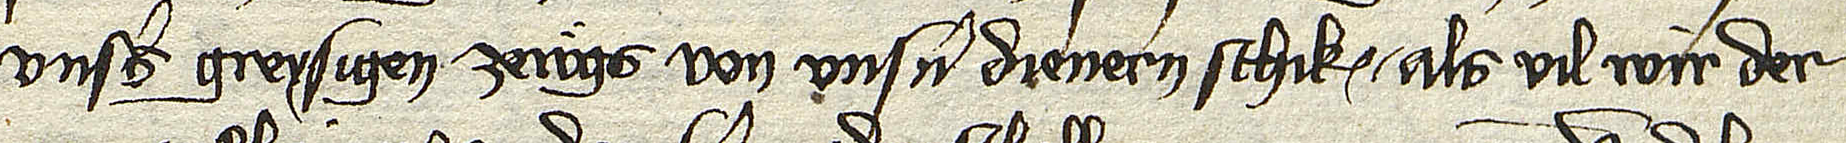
vnſ*s greyſigen ʒewgs von vnſ*n dienern ſchik* / als vil wir der
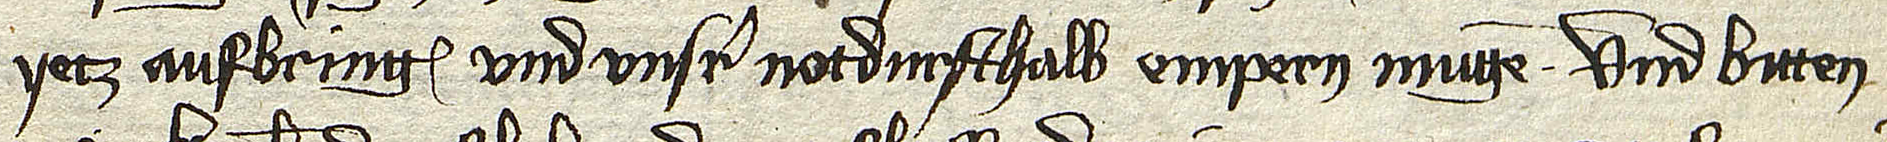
yecʒ aufbring* vnd vnſ*r notdurfthalb empern muge* . Vnd bitten
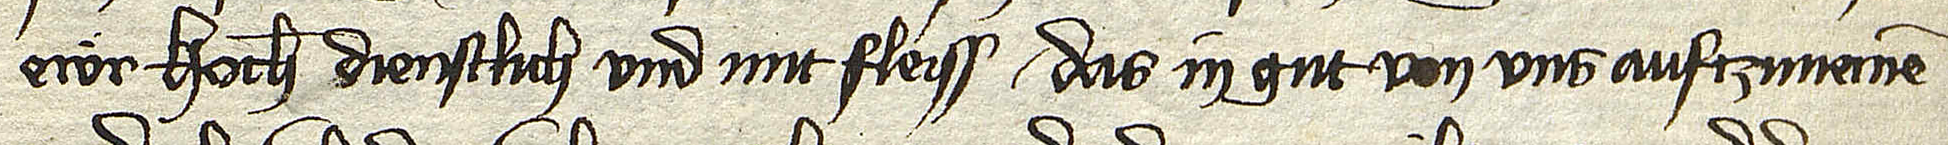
ewr hoch* dienſtlich vnd mit fleiſſ / das in gut von vns aufcʒuneme*
